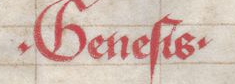.Geneſis.
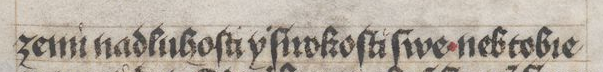zemi nadluhoſti ẛirokoſti ſwe.neb tobie
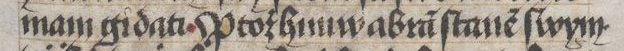maní gi dati.Ꝓtoż hnuw abrā ſtanē ſwym.
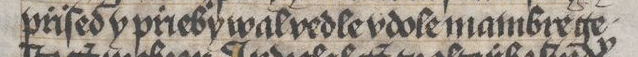pṙiẛed y pṙiebywal vedle vdole mambre ge¬
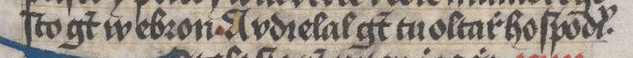ẛto ḡt webron.A vdielal ḡt tu oltaṙ hoſpodiv.
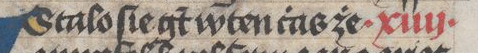Stalo ſie ḡt wten ċas że.xiiij.
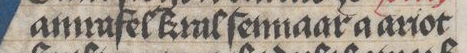amrafel kral ſemnaar a ariot
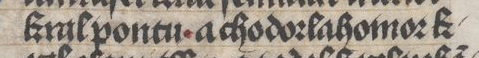kral pontu.a chodorlahomor k¬
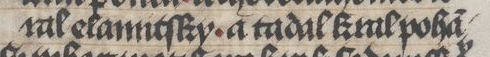ral elamitſky.a tadal kral pohā
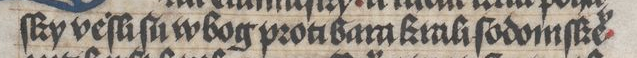ſky veẛli ſu wbog proti bara krali ſodomſkev.
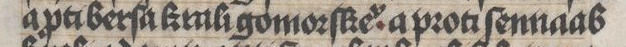a ꝓti berſa krali gomorſkev a proti ſennaab
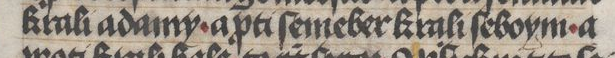krali adamy.aꝓti ſemeber krali ſeboym.a
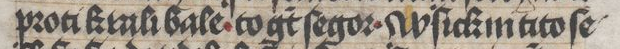proti krali bale.to ḡt ſegor.Wẛickni tito ſe¬
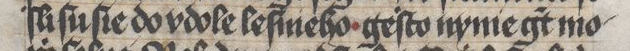ẛli ſu ſie do vdole leſnieho.geẛto nynie ḡt mo¬
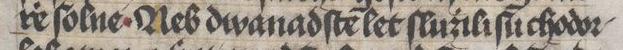ṙe ſolne.Neb dwanadſte let ſlużili ſu chodor¬
